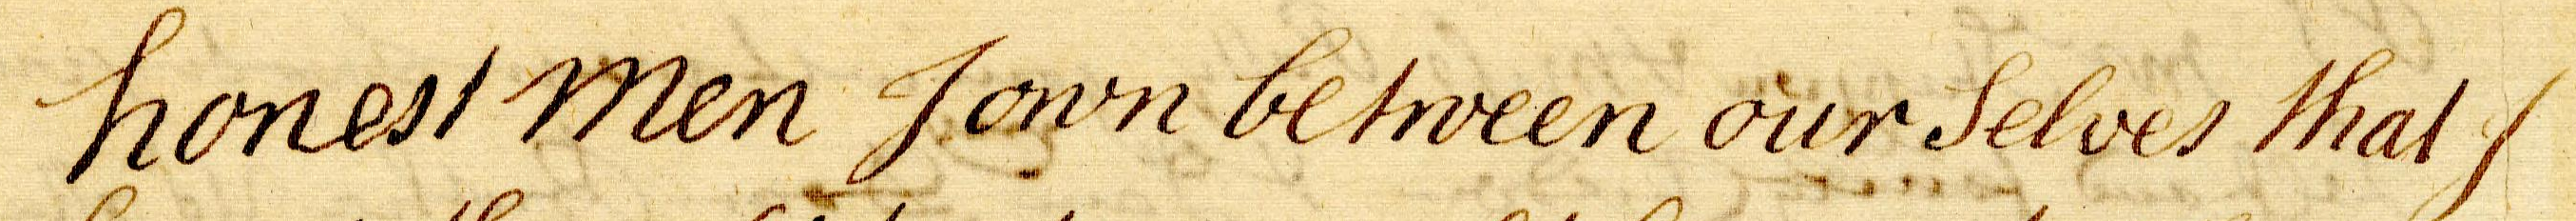honest Men Torn between our Selves that I
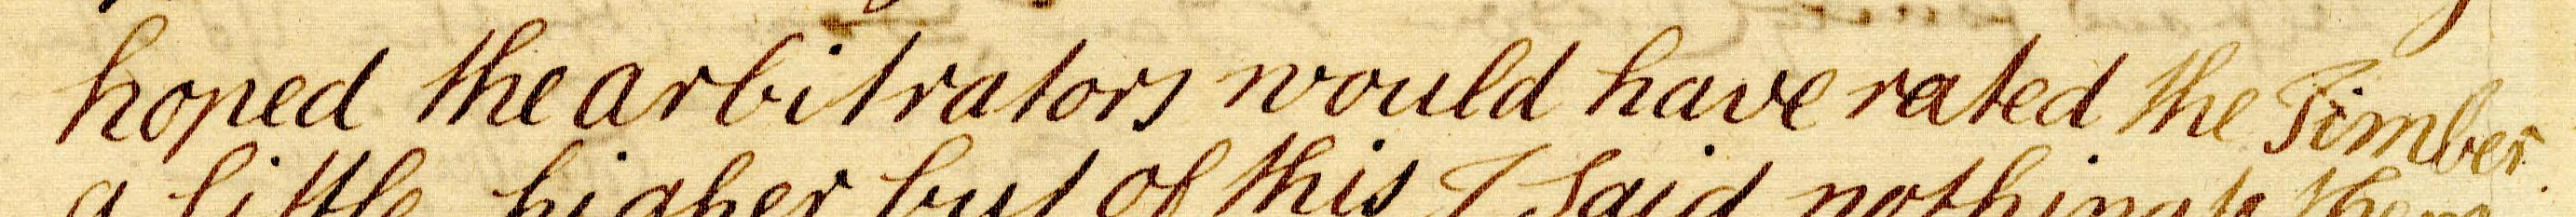hoped the arbitrators would have rated the Timber
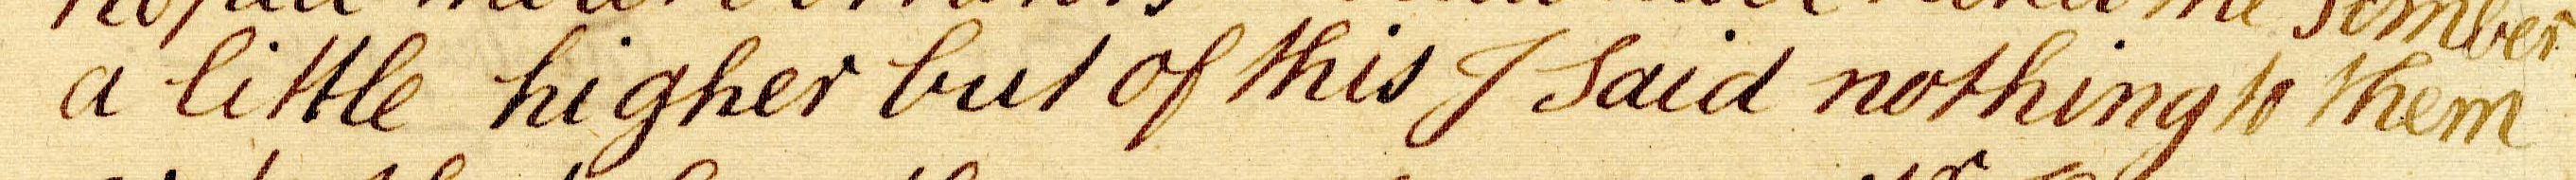a little higher but of this I said nothing to them
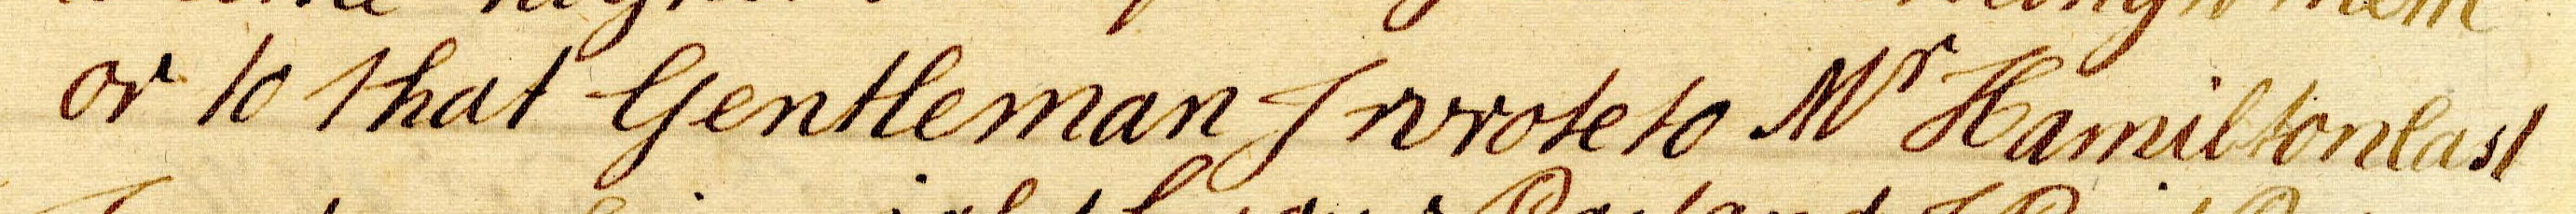or to that Gentleman I wrote to M^r Hamilton last
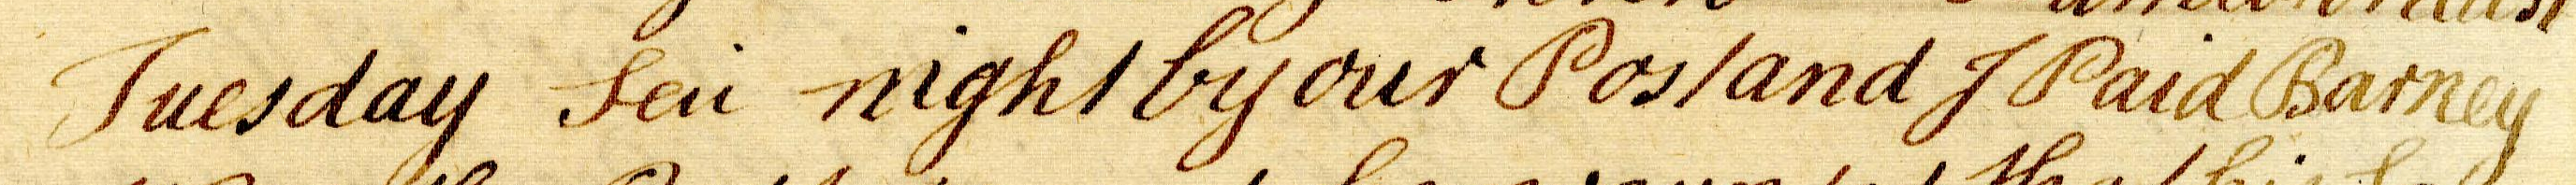Tuesday sei night by our Post and I Paid Barney
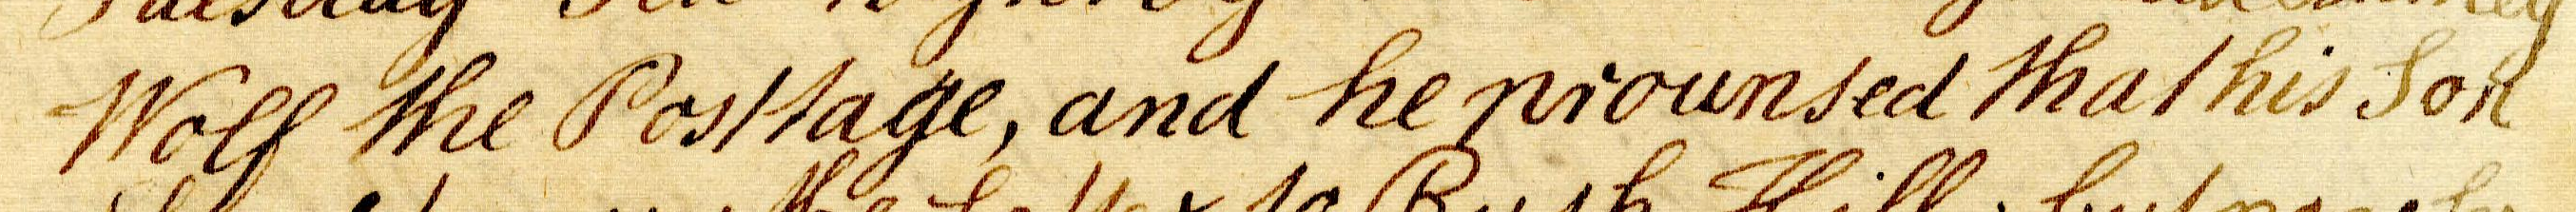Wolf the Posttage, and he prounsed that his Son
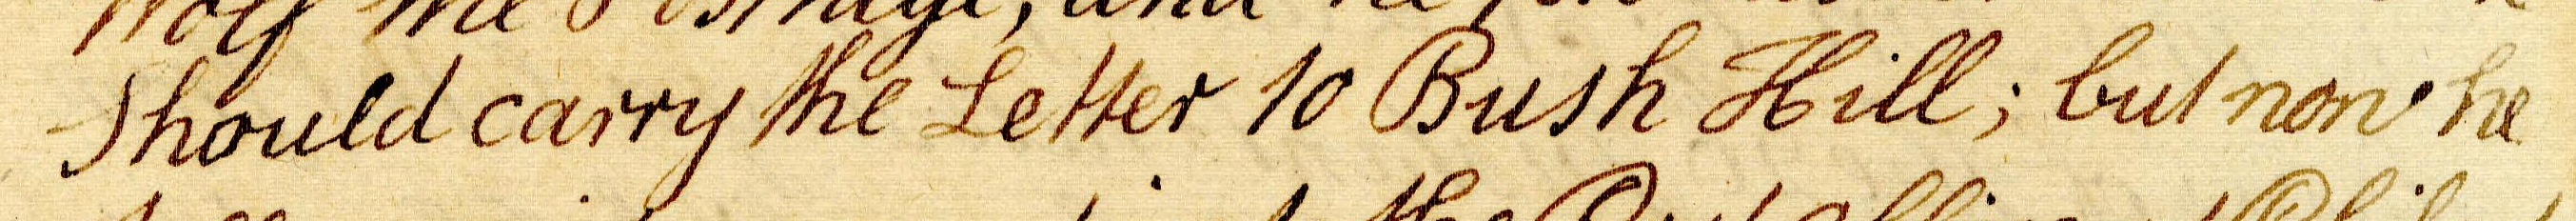Should carry the Letter to Bush Hill; but now he
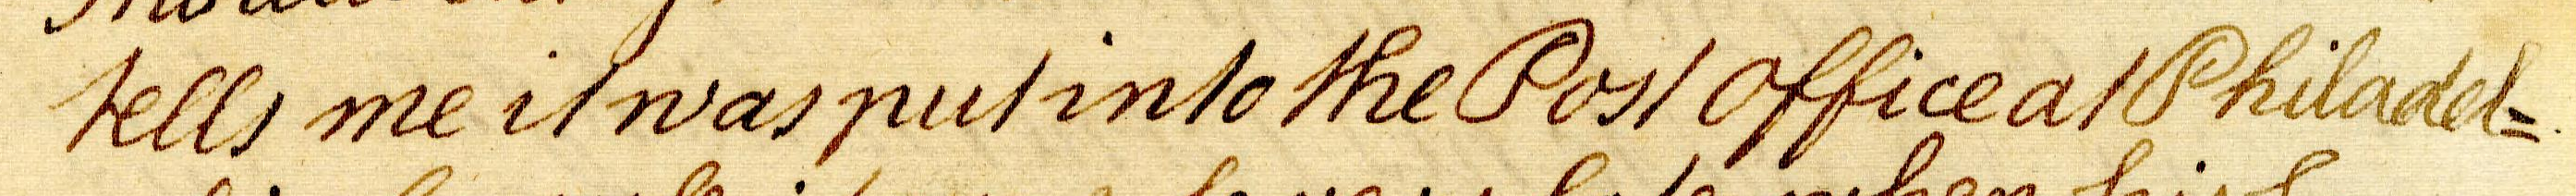tells me it was put into the Post office at Philadel-
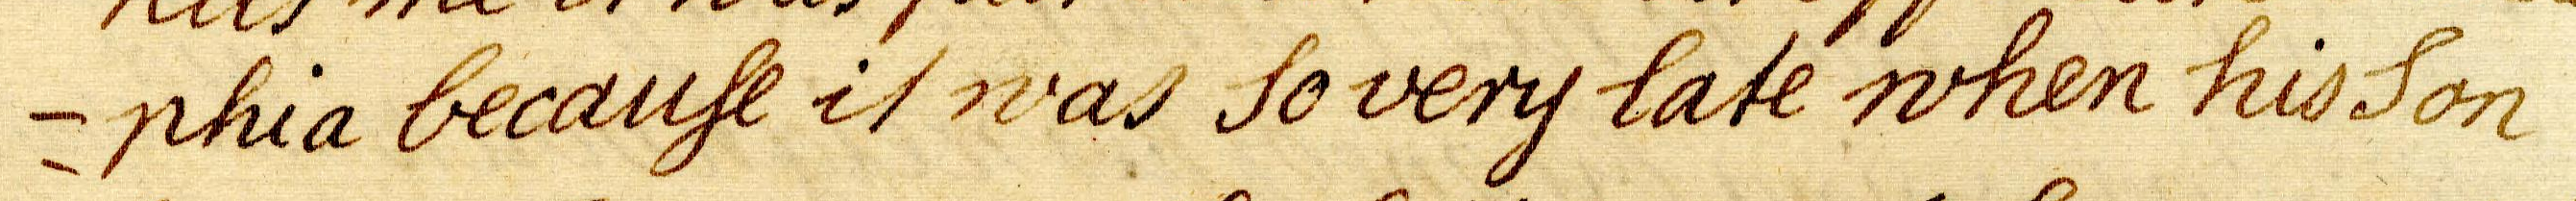-phia because it was so very late when his Son
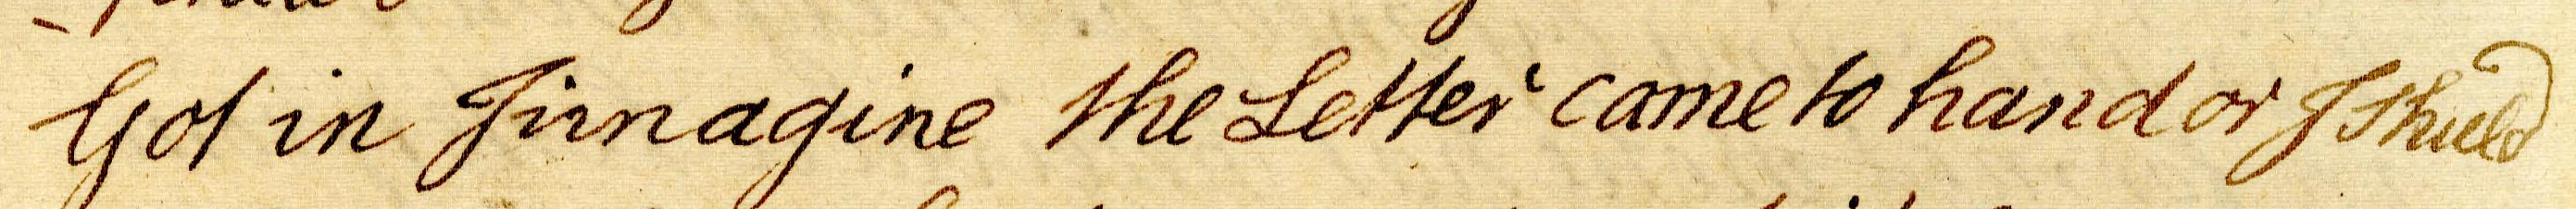Got in finnagine the Letter came to hand or I shield
